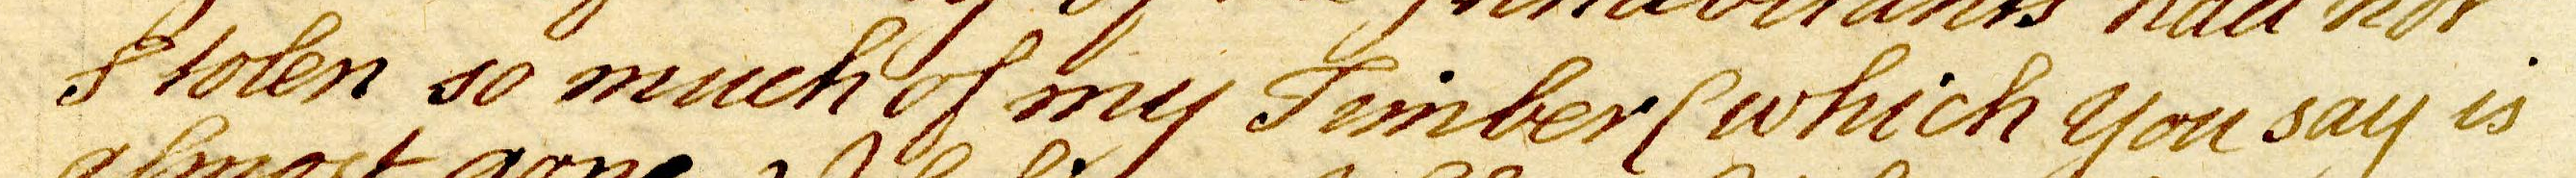Stolen so much of my Timber (which You say is
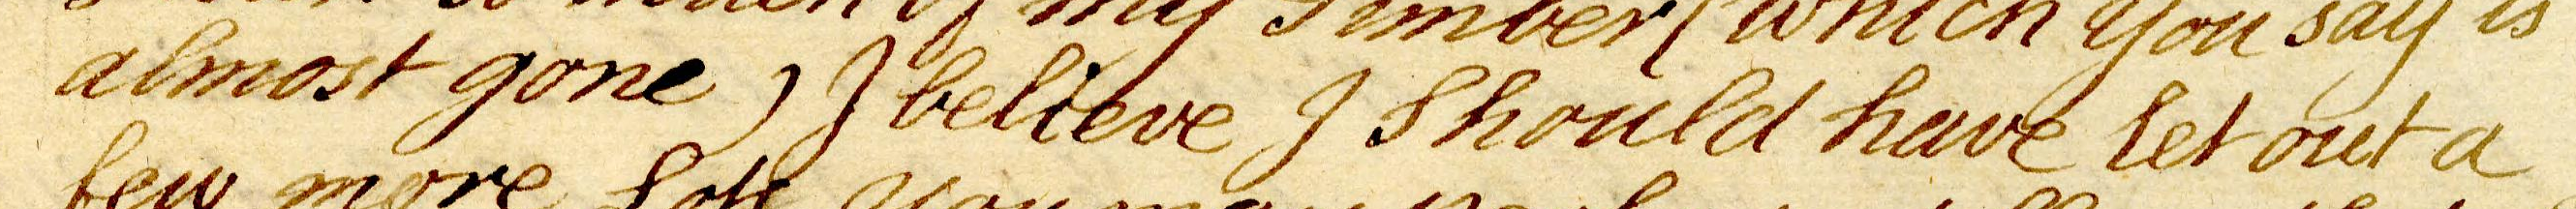almost gone) I believe I Should have let out a
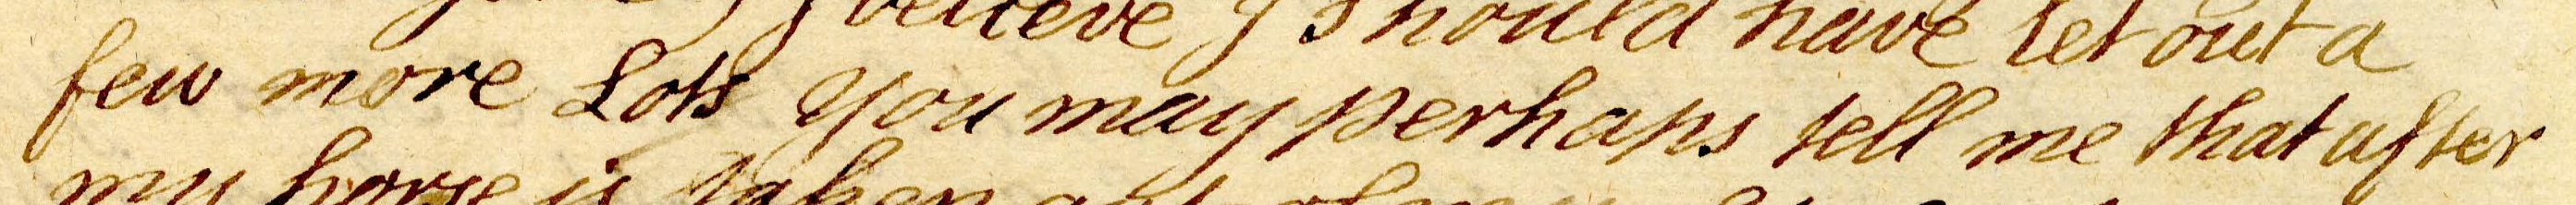few more Lots You may perhaps tell me that after
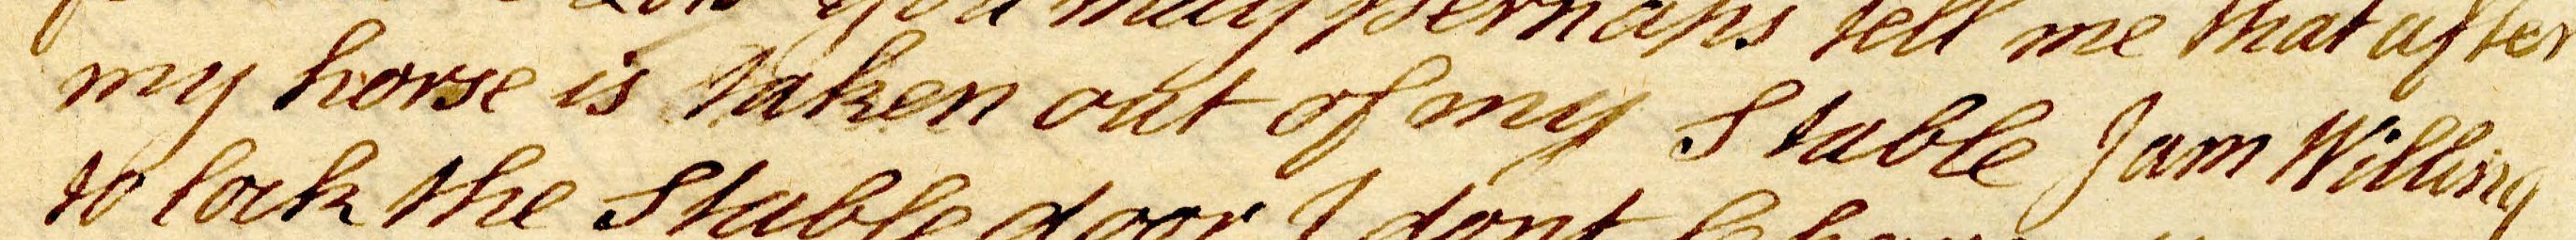my horse is taken out of my Stable I am Willing
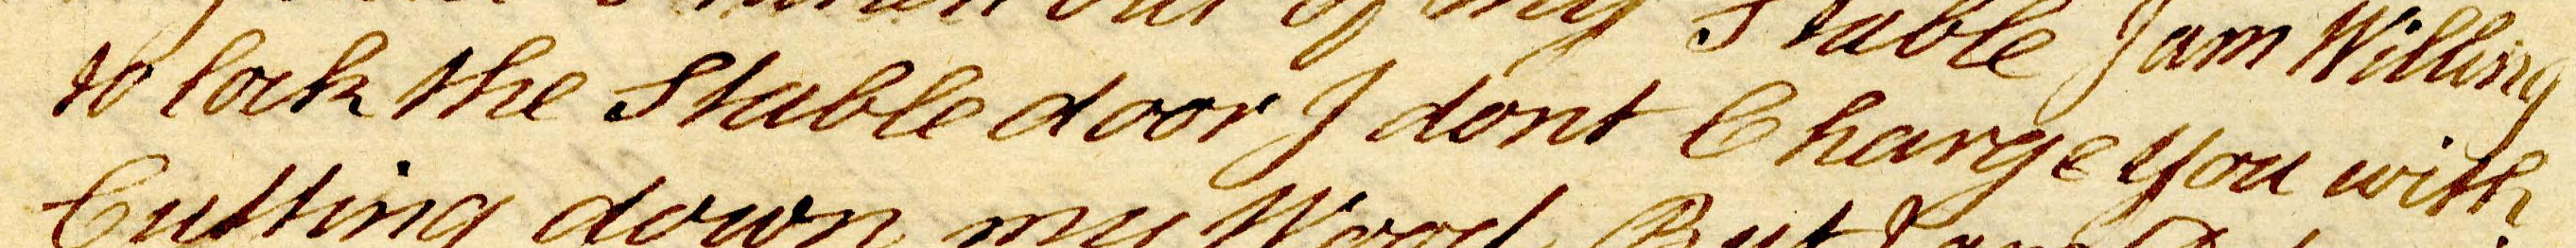to lock the Stable door I dont Charge You with
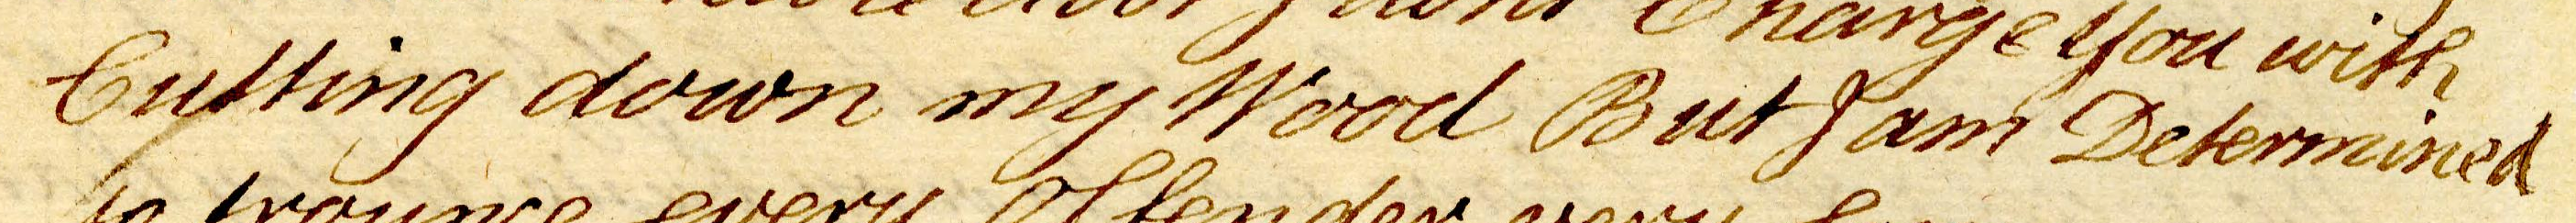Cutting down my Wood But I am Determined
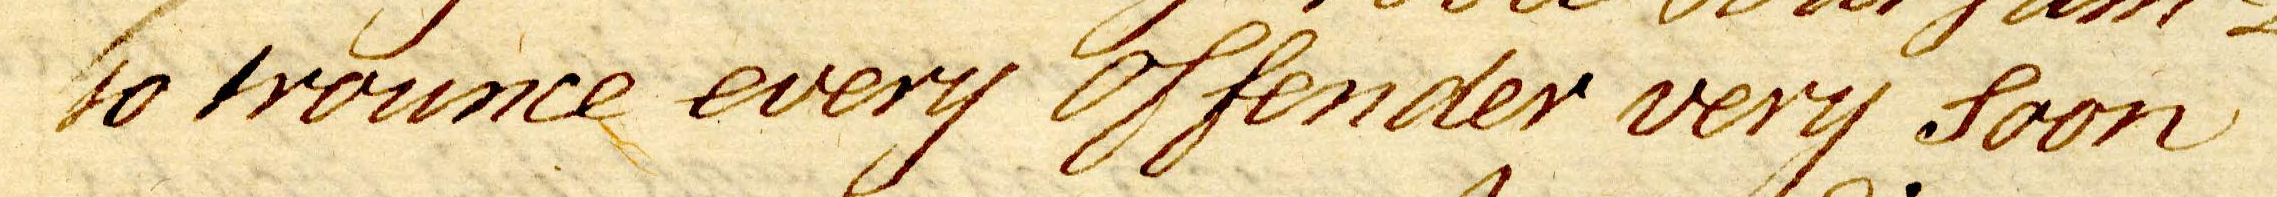to trounce every offender very Soon
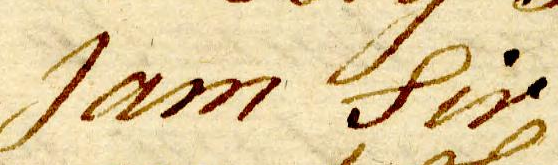I am Sir
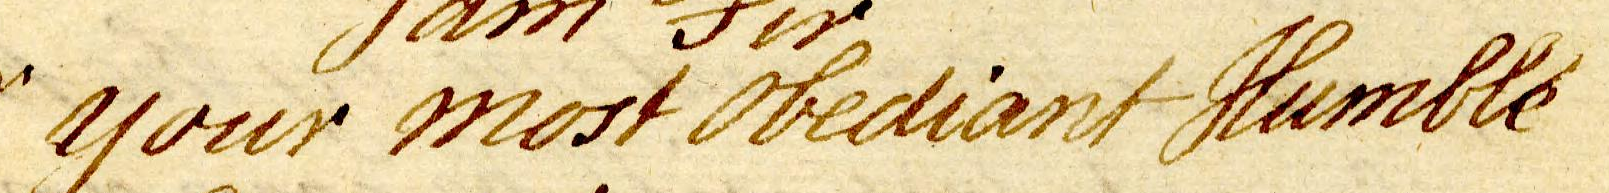Your most obediant Humble
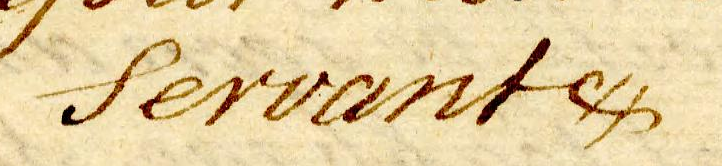Servant &
